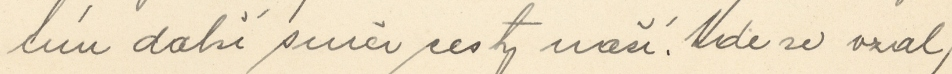tím další směr cesty naší. Kde se vzal
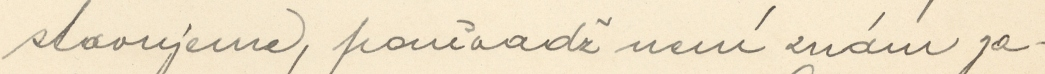stavujeme, poněvadž není znám za-
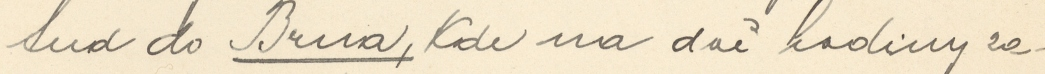tud do Brna, kde na dvě hodiny za-
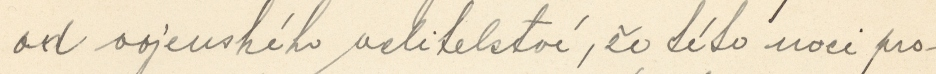od vojenského velitelství, že této noci pro-
